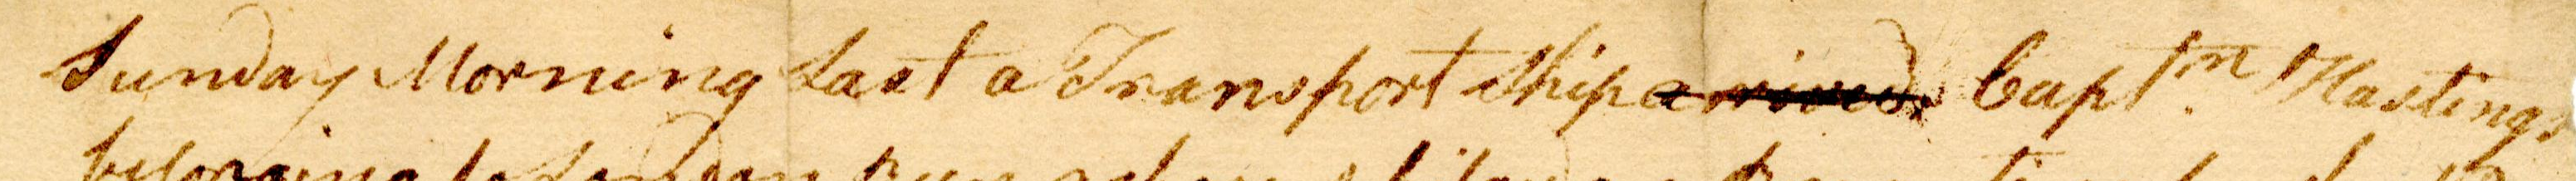Sunday Morning Last a Transport ship [arrived] Capt^n. Hasting
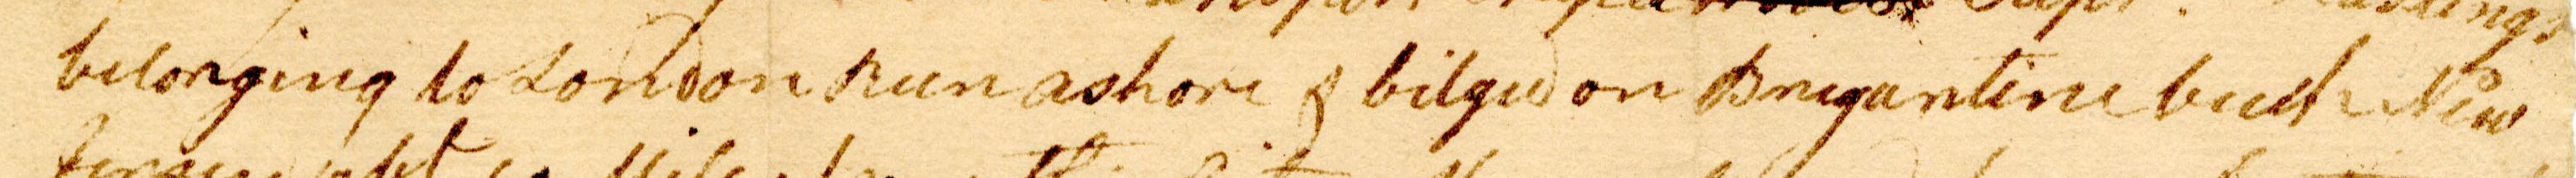belonging to London Run ashore & bilged on Brigantine beach New
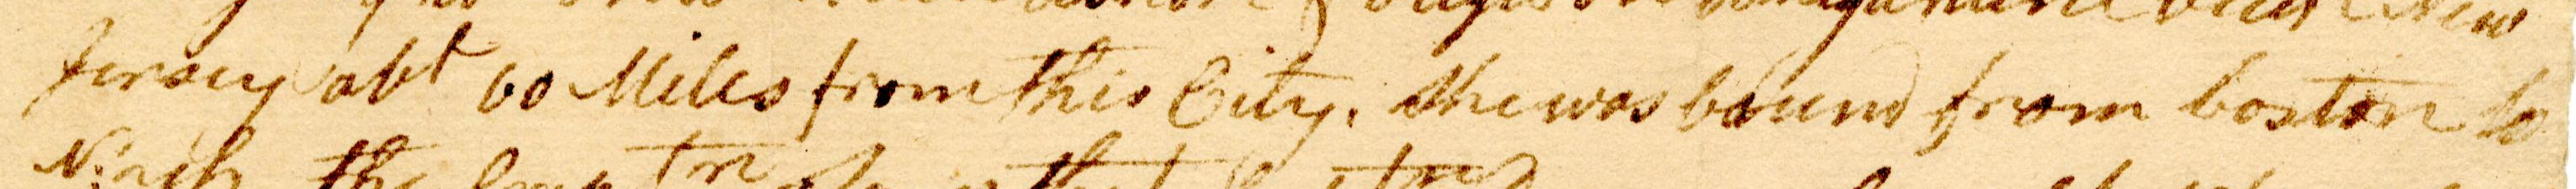Jersey ab^t 60 Miles from this City, she was bound from Boston to
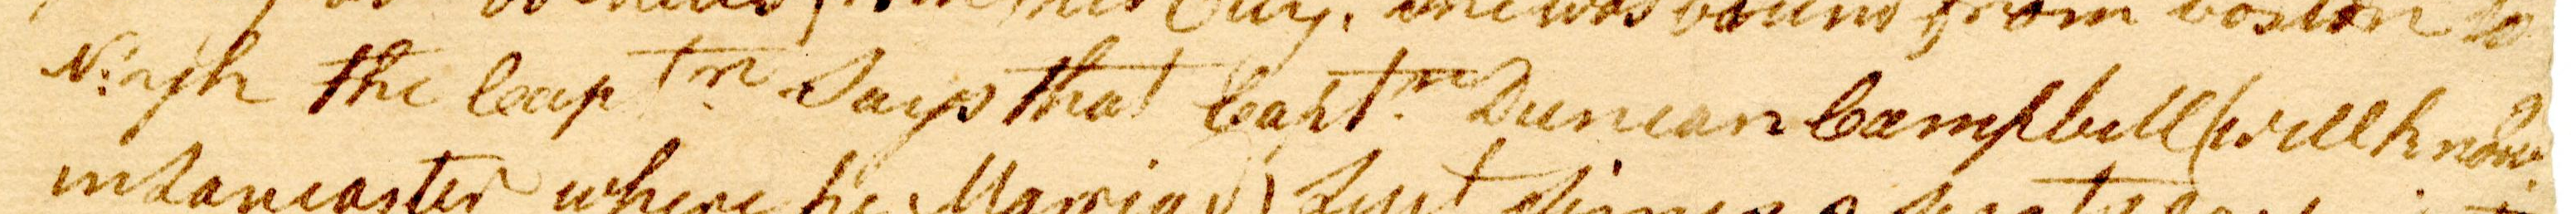N: yk the Cap^tn. Says that Capt^n. Duncan Campbell (will know
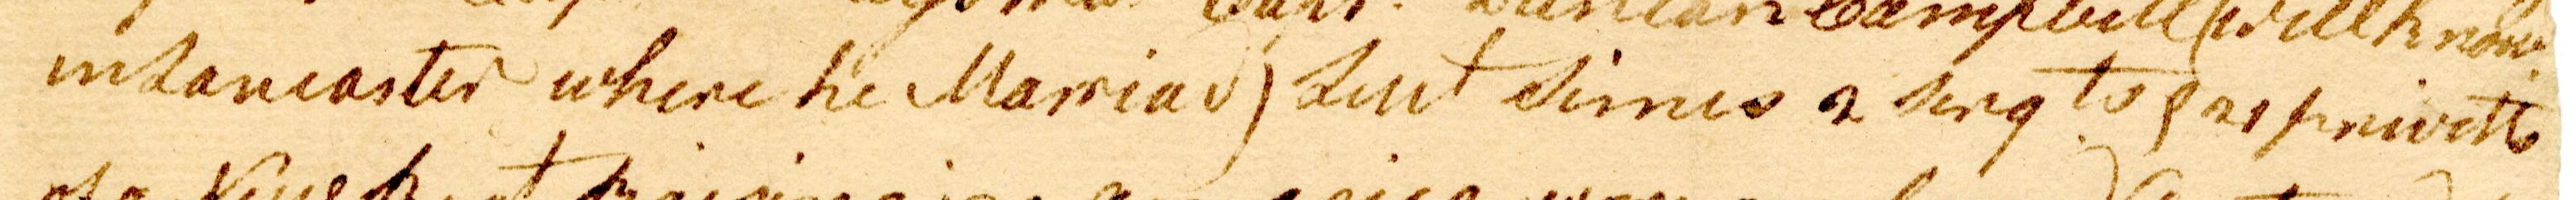in Lancaster where he Married) sent Sims 2 serg^ts. & 21 privetts
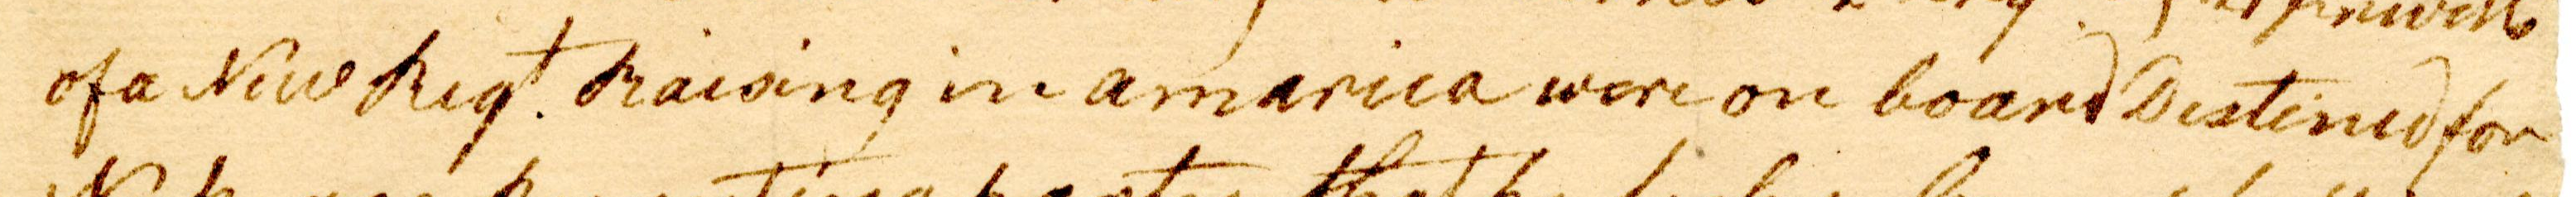of a New Reg^t. Raising in amarica were on board Destined for
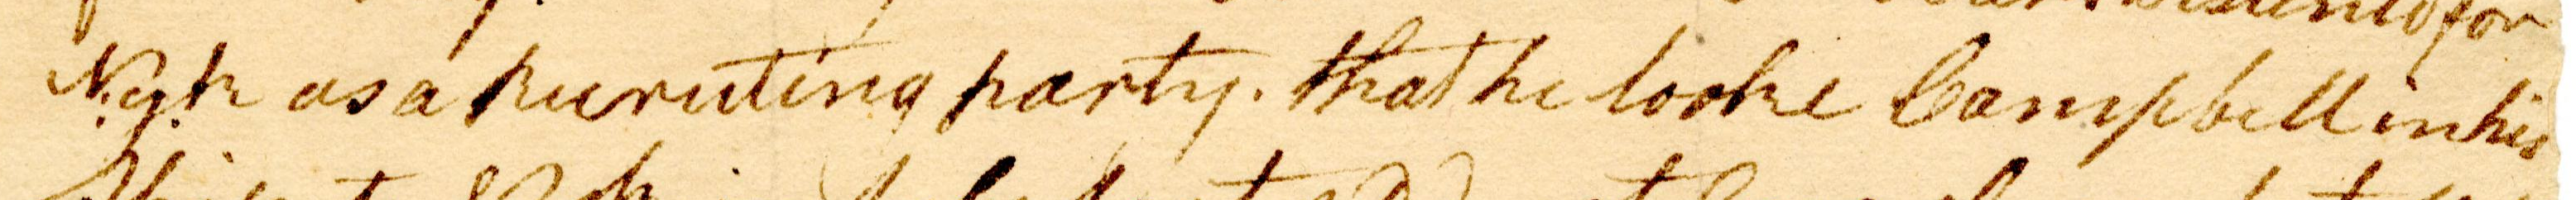N: yk as a Recruiting party, that he tooke Campell in his
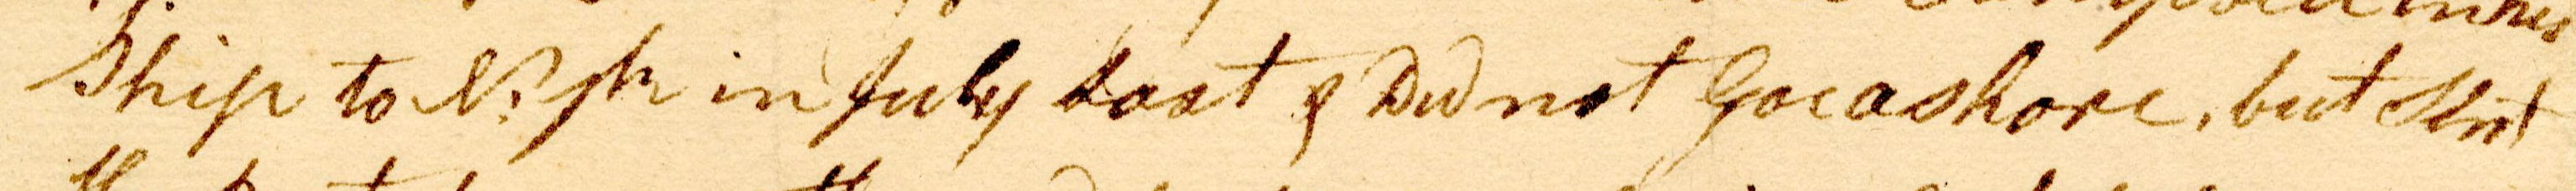Ship to N: yl in July last & Did not Goe ashore, but Sent
